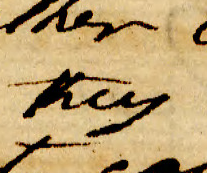they
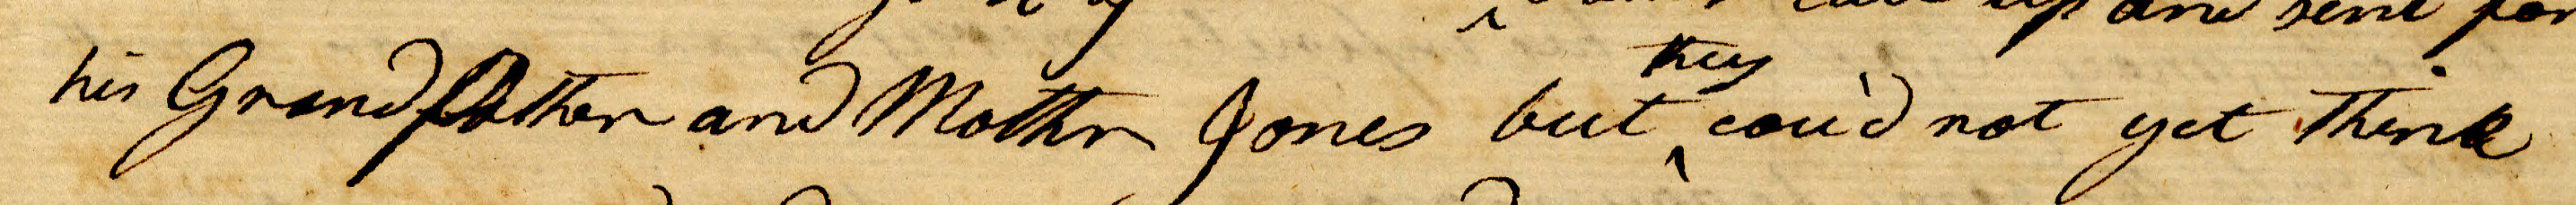his Grandfather and Mother Jones but ^ cou'd not yet think
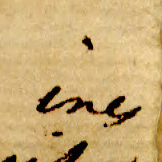ing
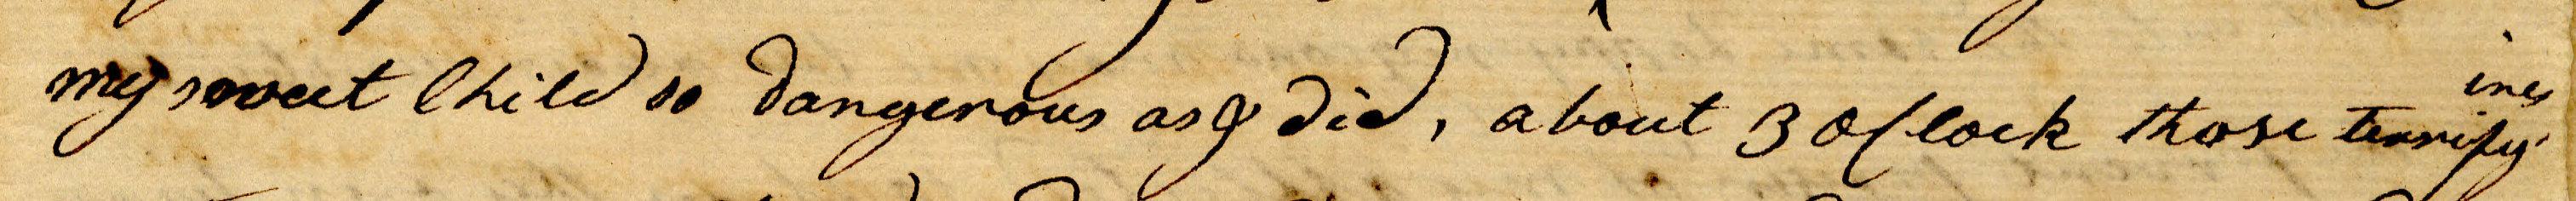my sweet Child so dangerous as I did, about 3 oClock those terrify-
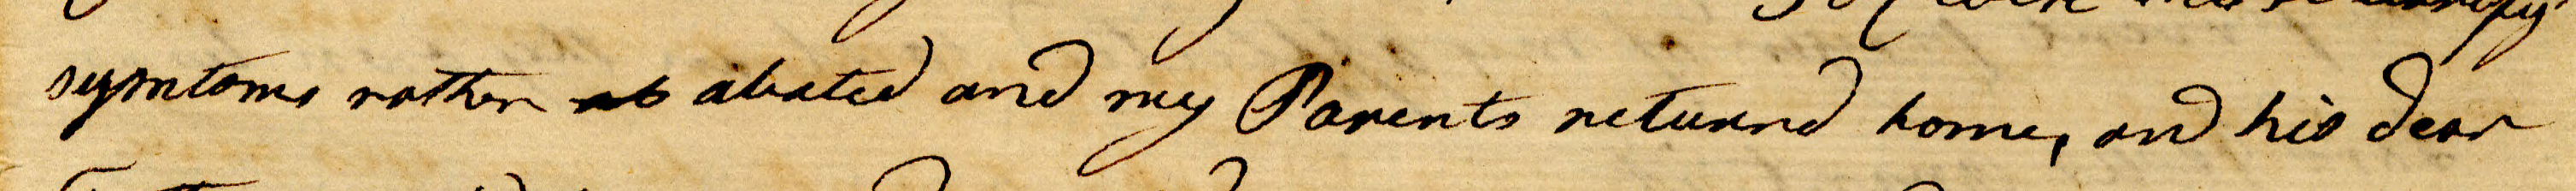symtoms rather abated and my Parents returned home, and his dear
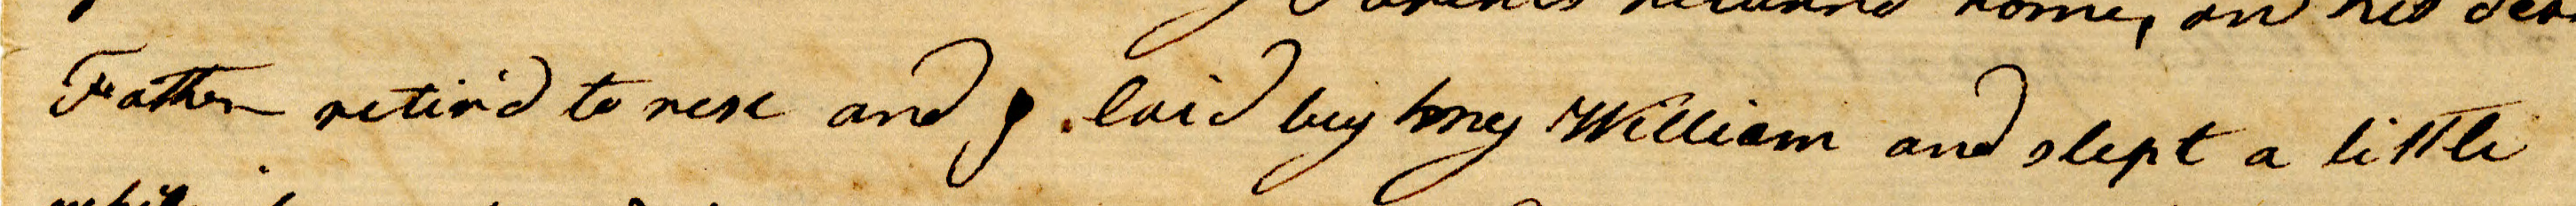Father retir'd to rest and I laid by my William and slept a little
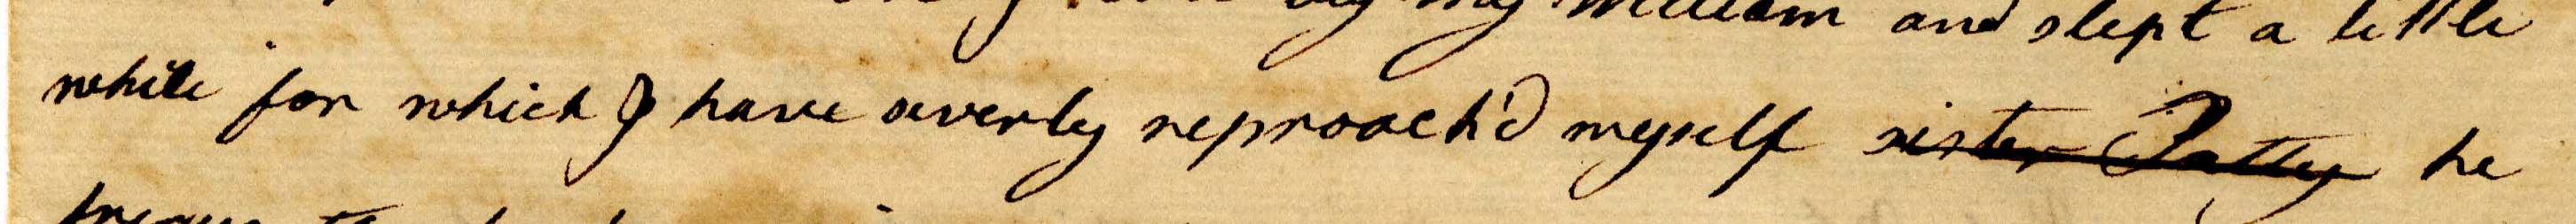while for which I have severly reproach'd myself [sister Patty] he
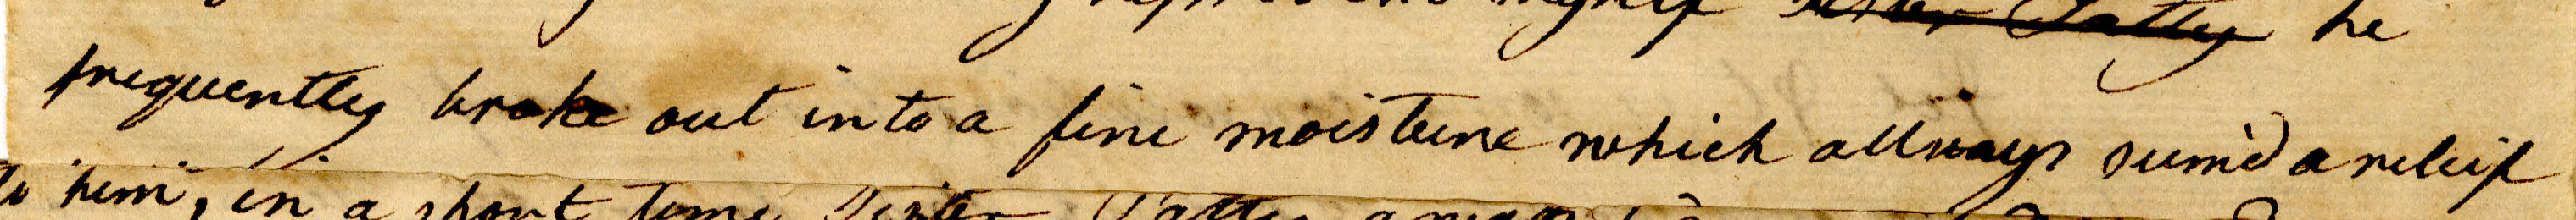frequently broke out into a fine moisture which allways seem'd a relief
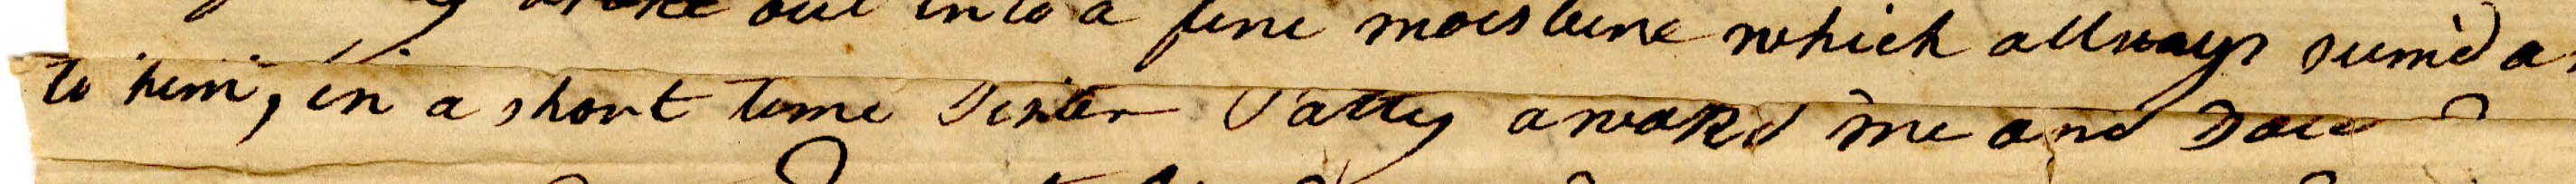to him, in a short time Sister Patty awakd me and said
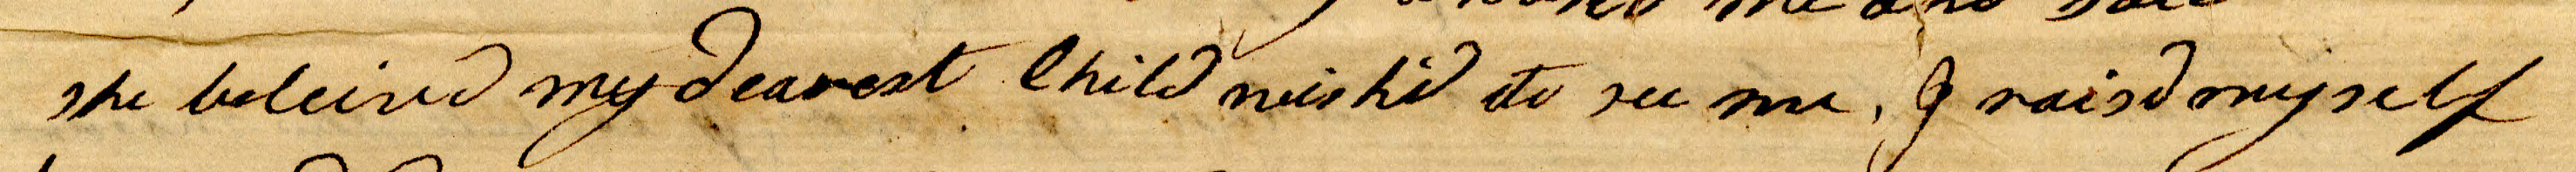she beleivd my dearest Child wish'd to see me. I raisd myself
